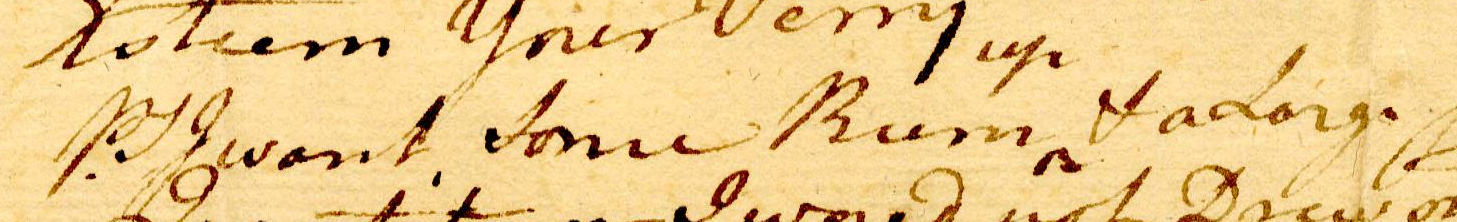P.S I want some Rum & a large
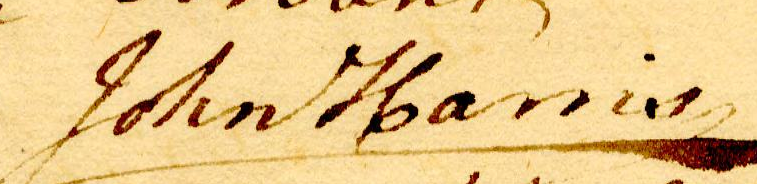John Harris
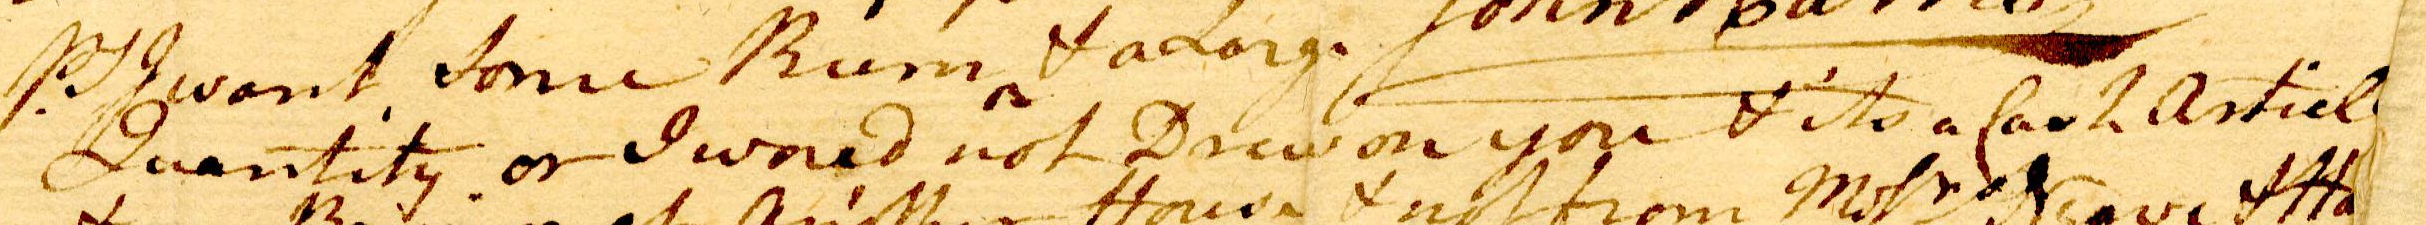Quantity or I woud not Draw on you & its a Cash Article
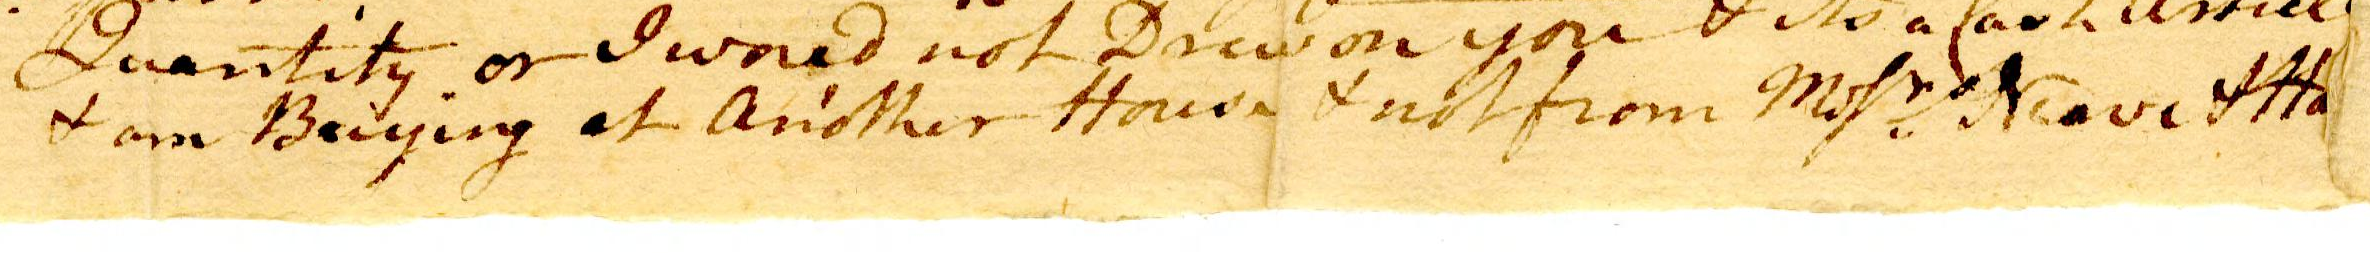& am Buying at Another House & not from Mes^r Neave & Ha
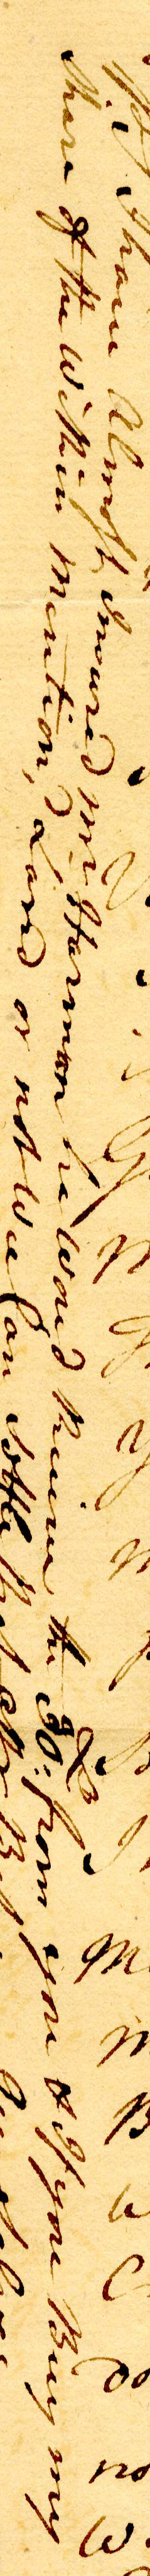P.S. I have almost Insured M^r. Harman he would Receive the 30. from you & if you Buy my
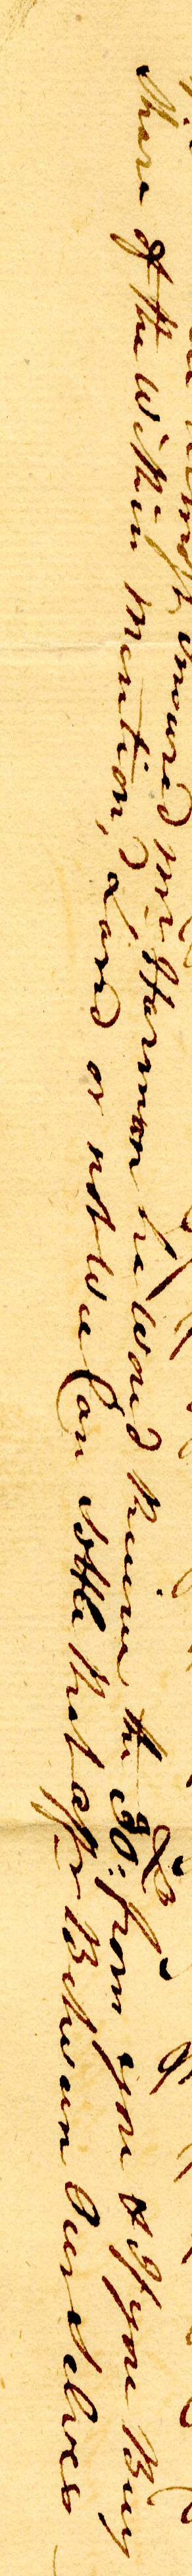share of the within mention,d Land or not Wee can settle that off^r Between Our selves
